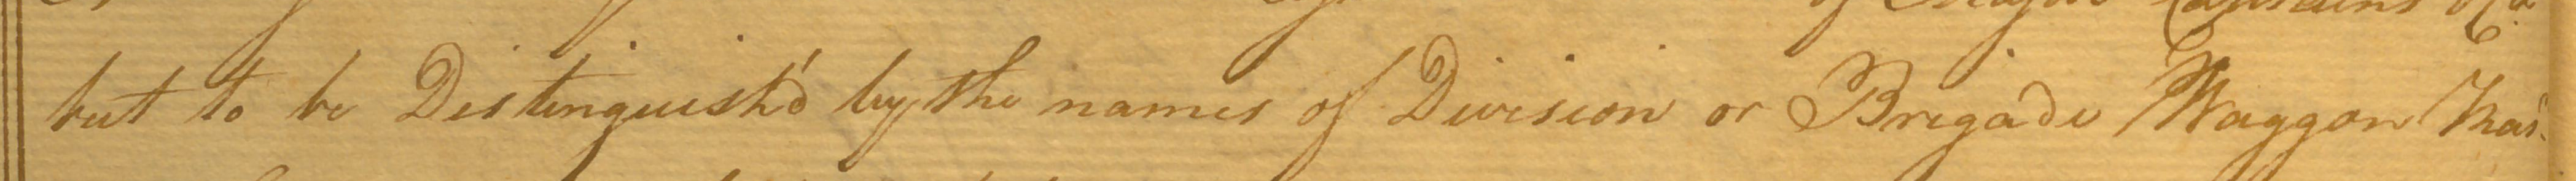but to be Distinguish'd by the names of Division or Brigade Waggon Mas.
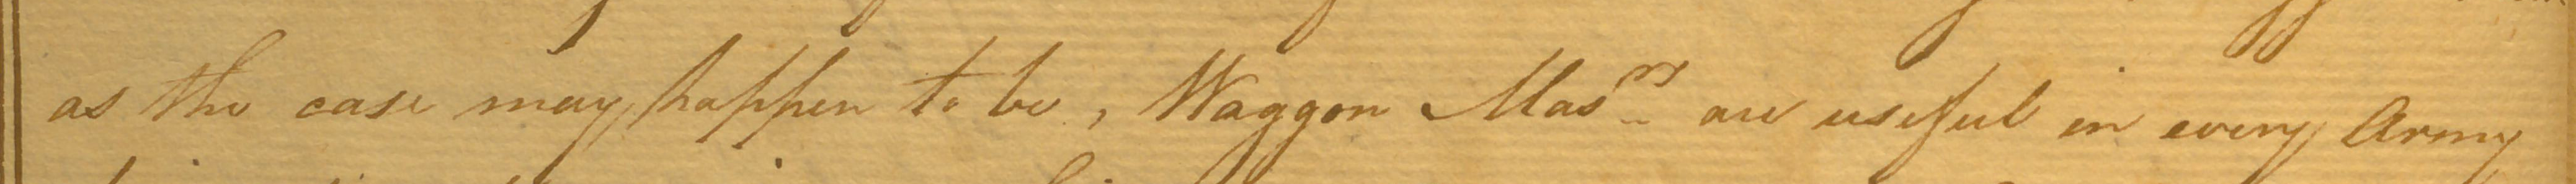as the case may happen to be, Waggon Mas^rs. are useful in every Army
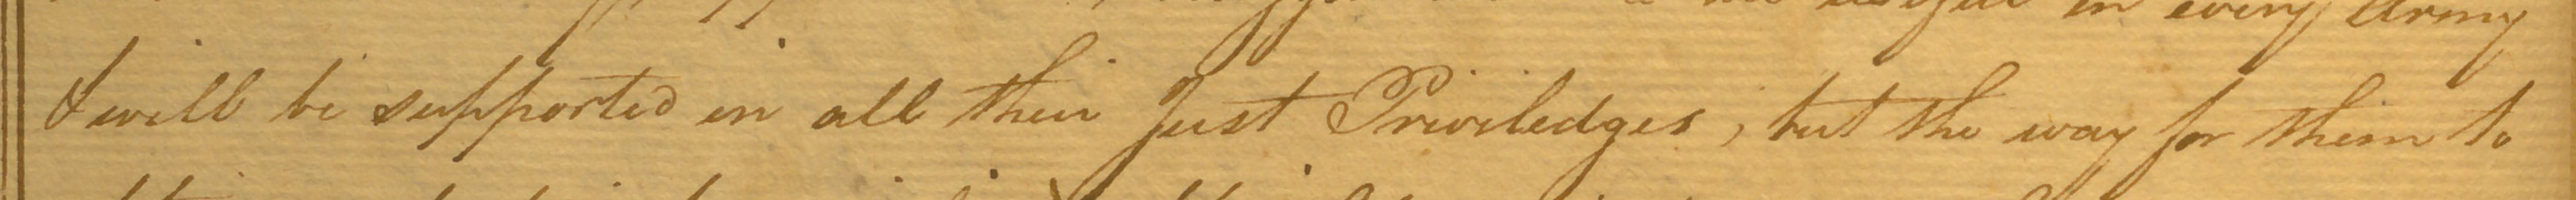& will be supported in all their Just Priviledges, but the way for them to
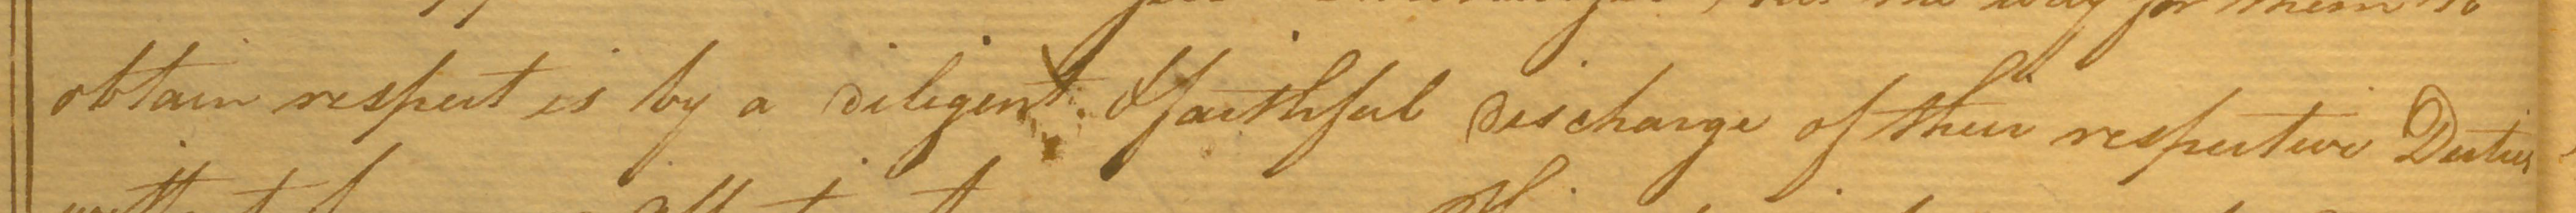obtain respect is by a diligent & faithful discharge of their respective Duties
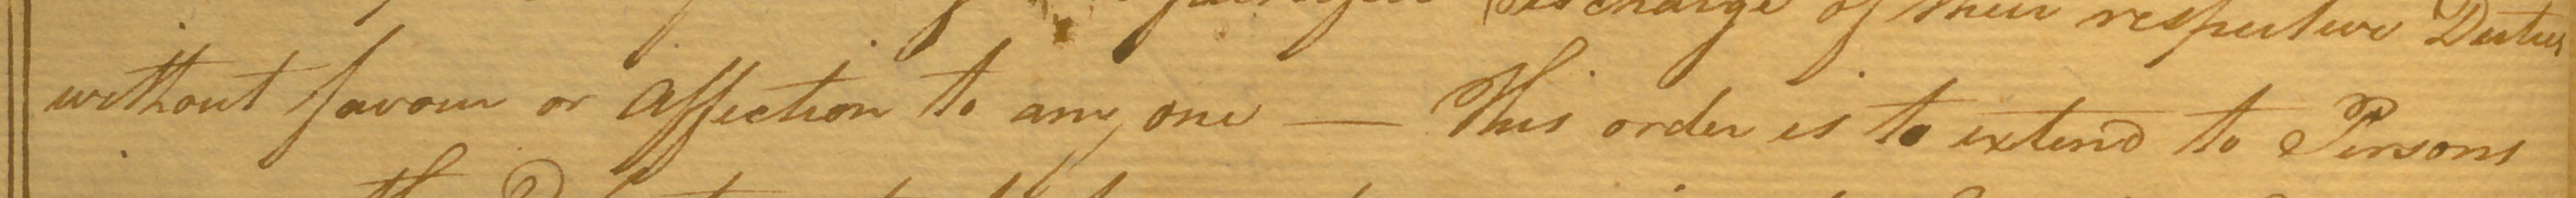without favour or Affection to any one- This order is to extend to Persons
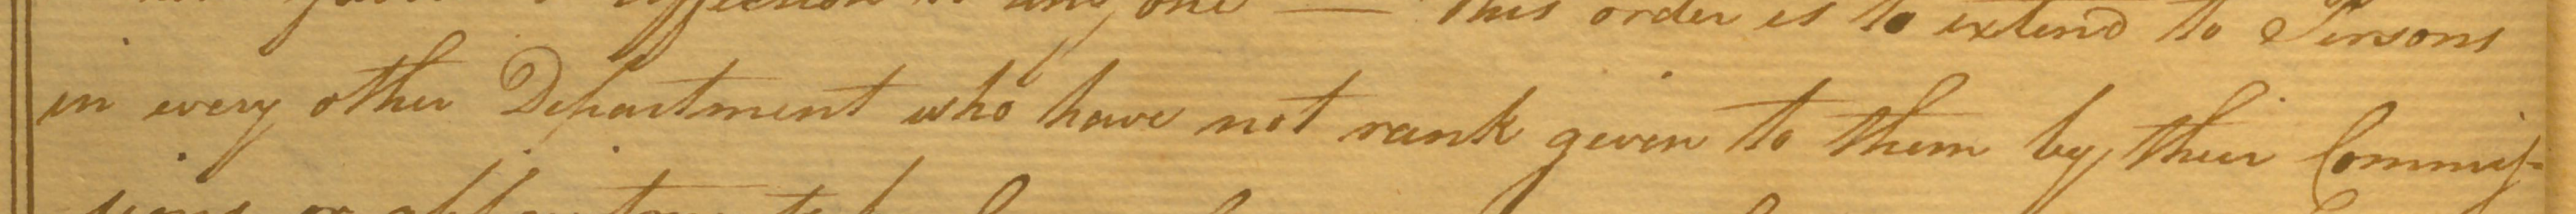in every other Department who have not rank given to them by their Commis-
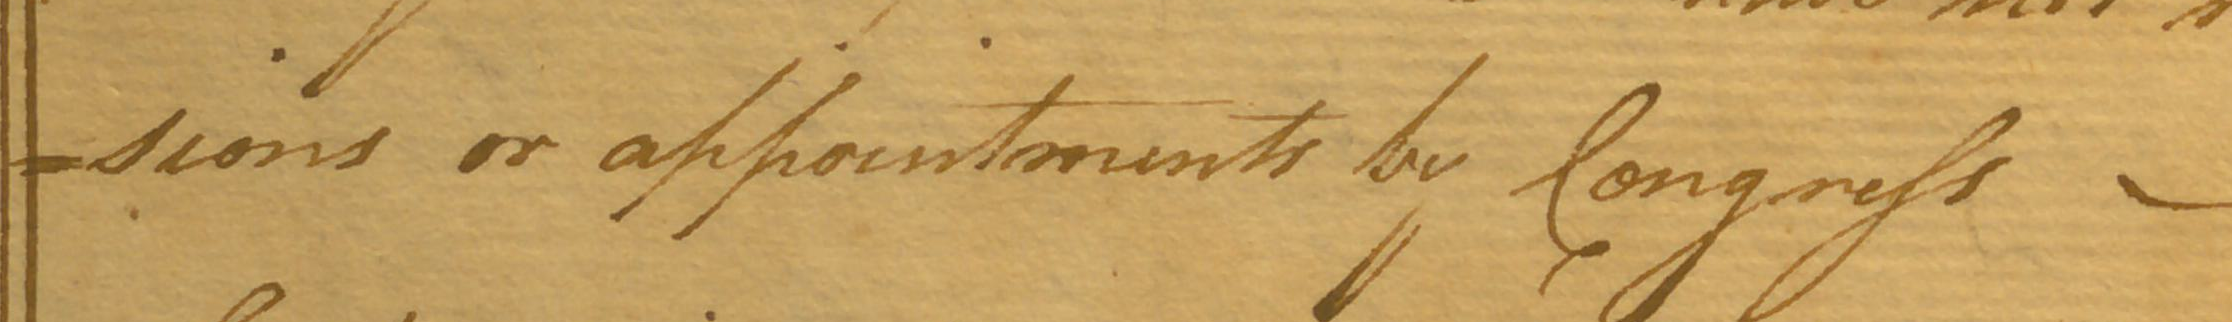-sions or appointments by Congress-
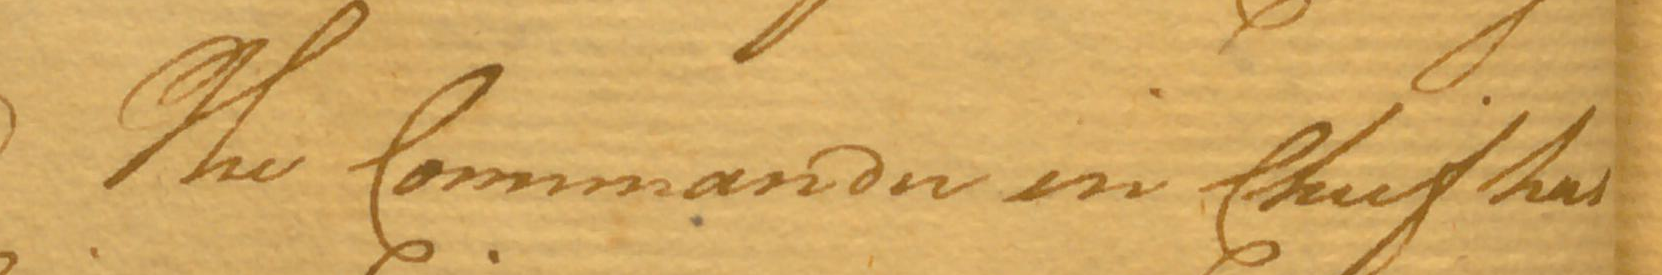The Commander in Chief has
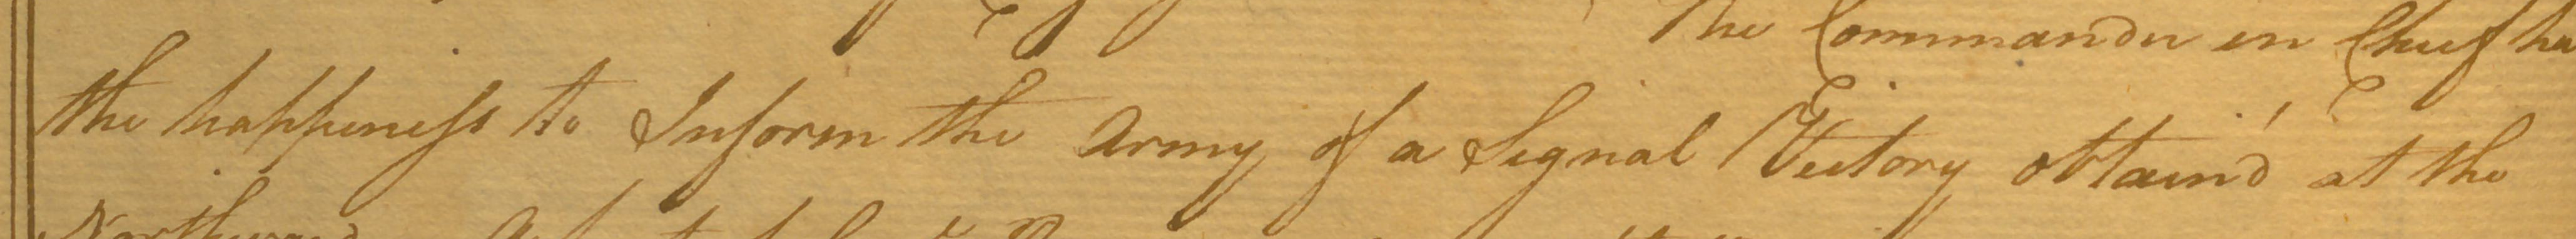the happiness to Inform the Army of a Signal Victory obtain'd at the
